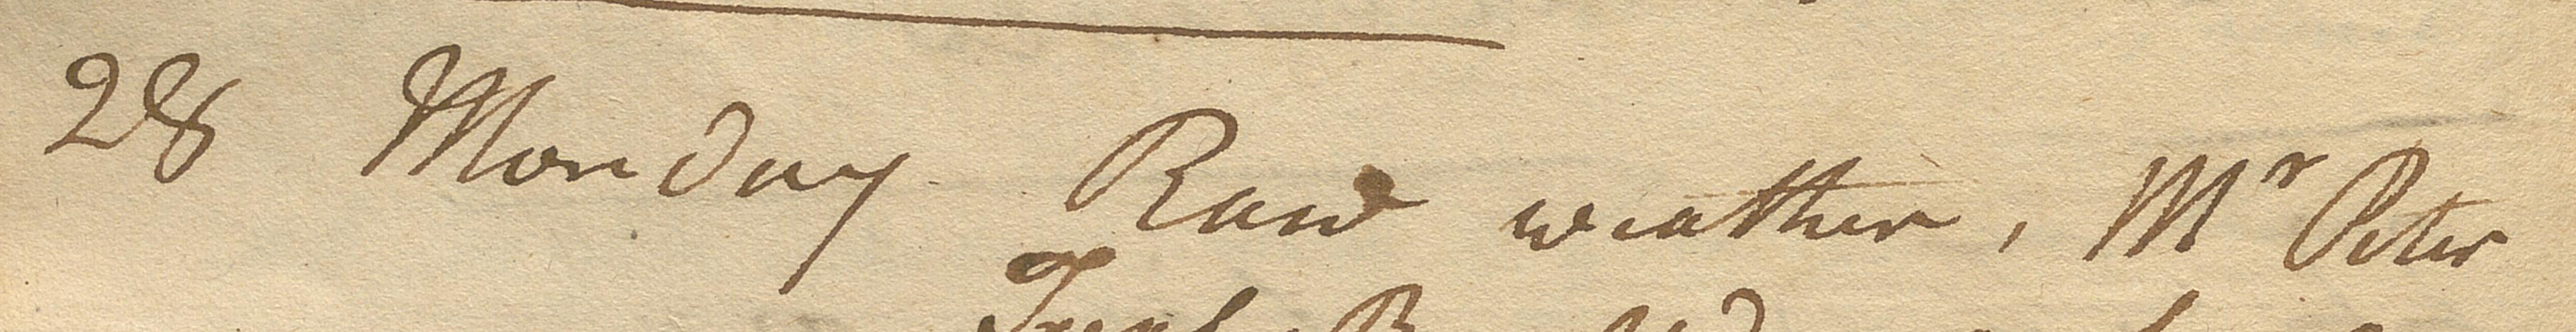28 Monday Raw weather, M^r. Peter
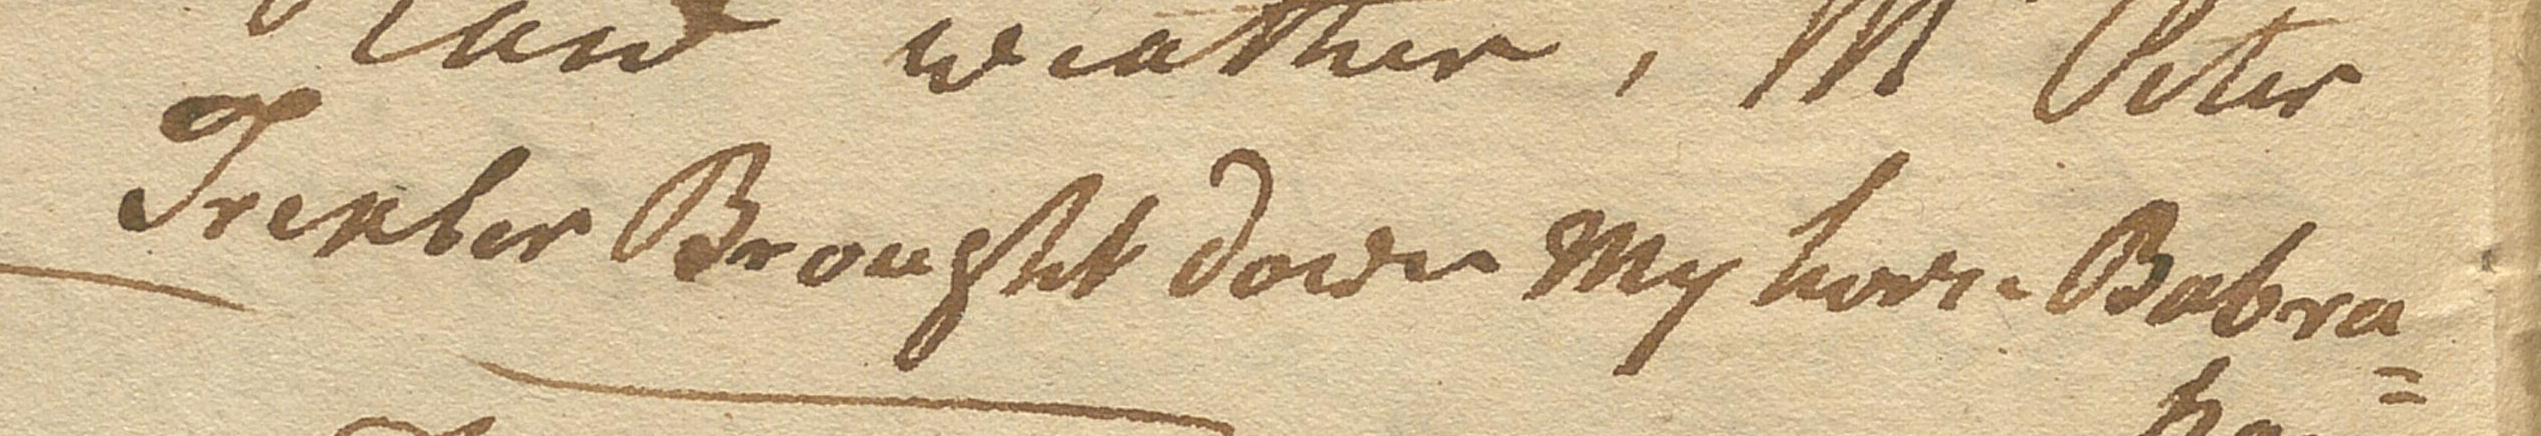Trenler Brought down My horse Babra-
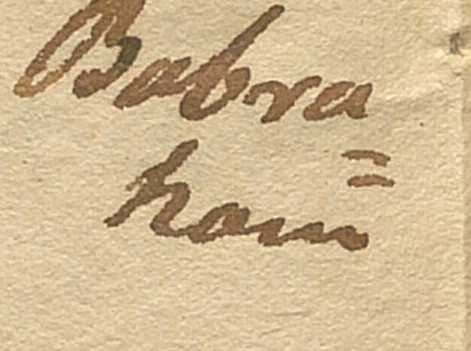ham
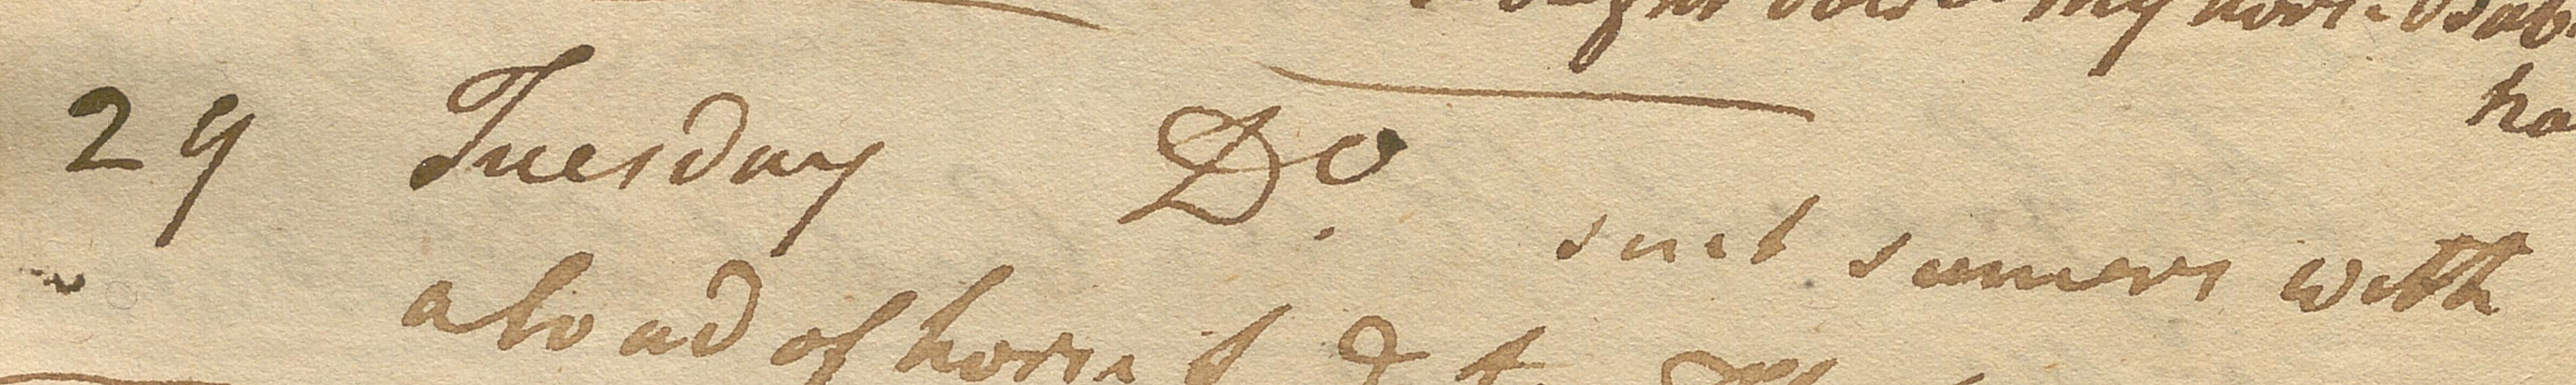29 Tuesday D^o sent sumers with
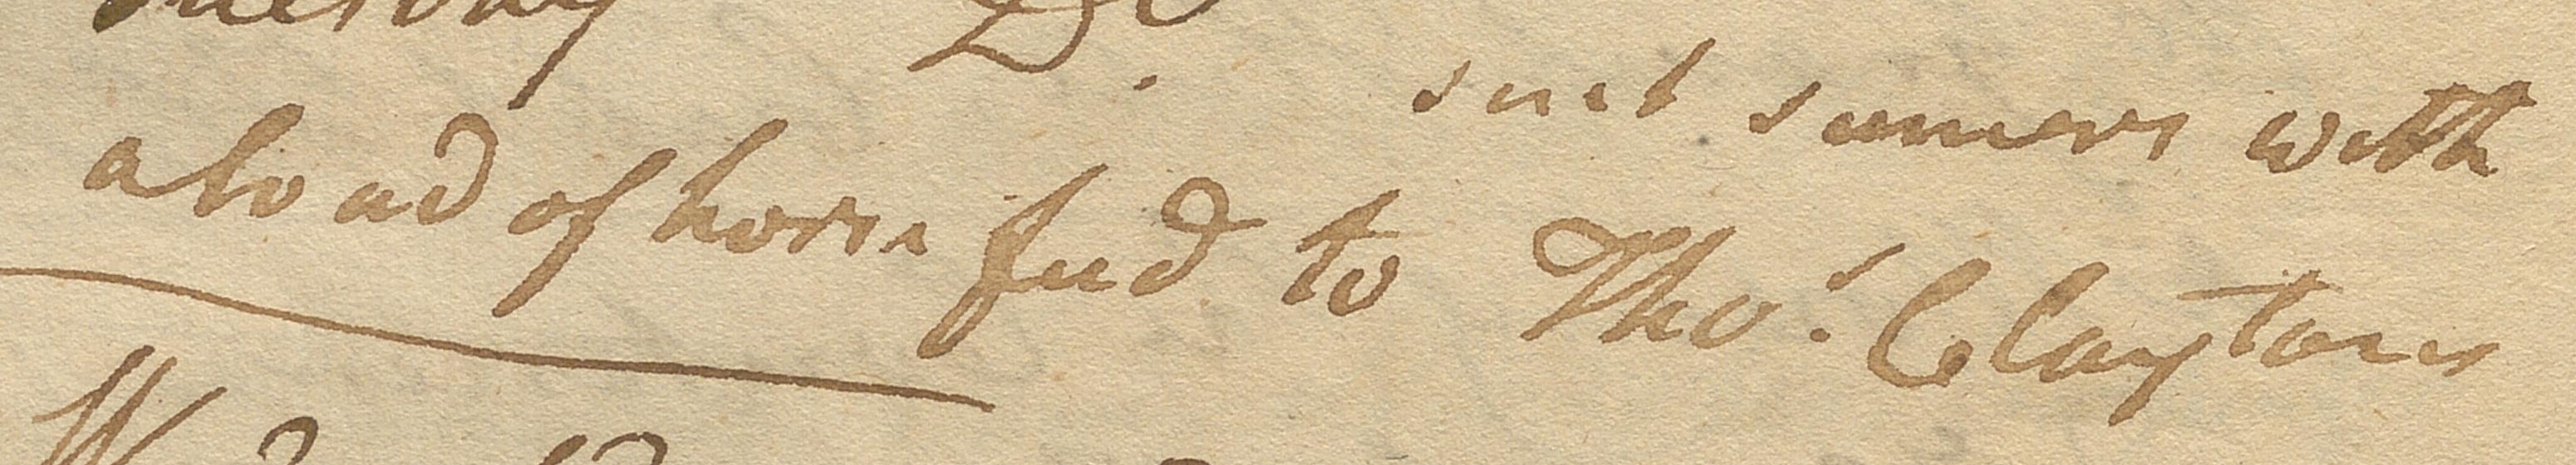a load of hore feed to Tho^s. Claytons
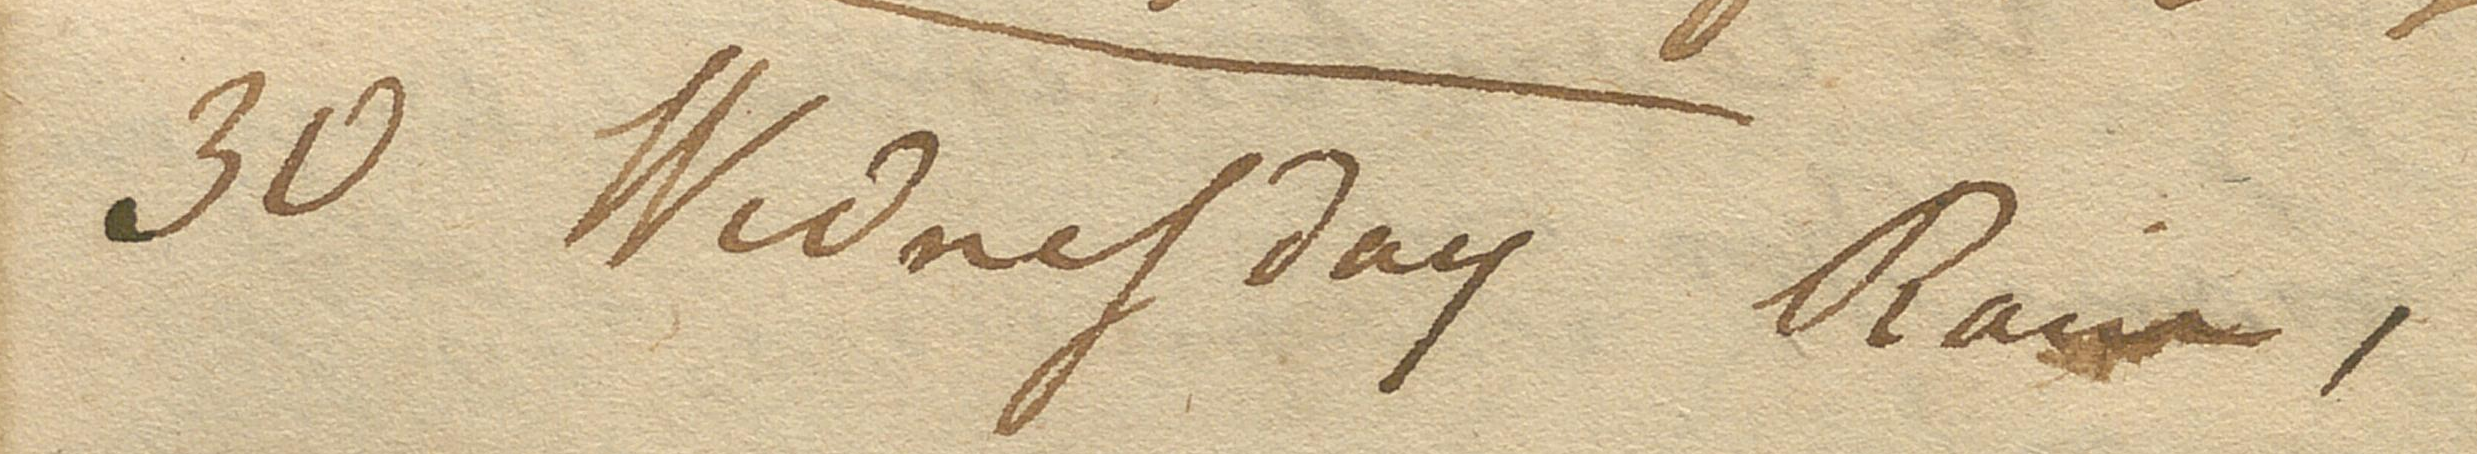30 Wednesday Rain,
